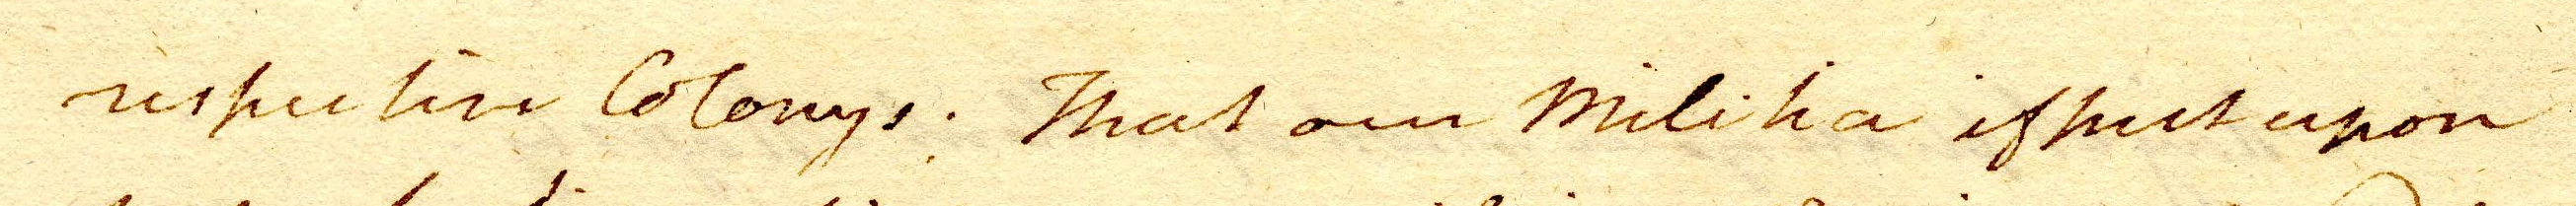respective Colonys. That our Militia is put upon
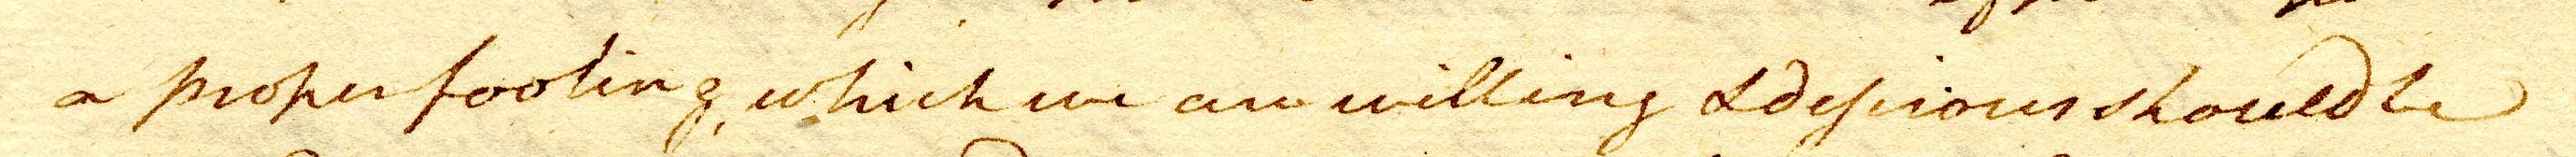a proper footing, which we are willing & desirous should be
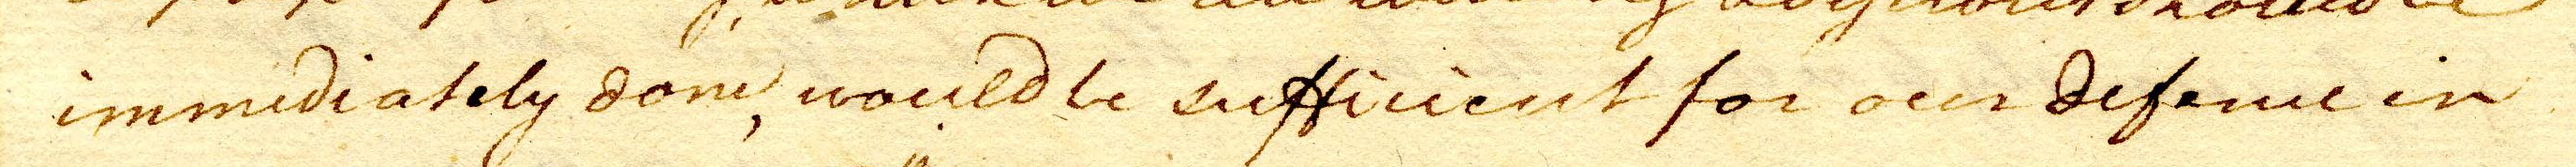immediately done, would be sufficient for our Defence in
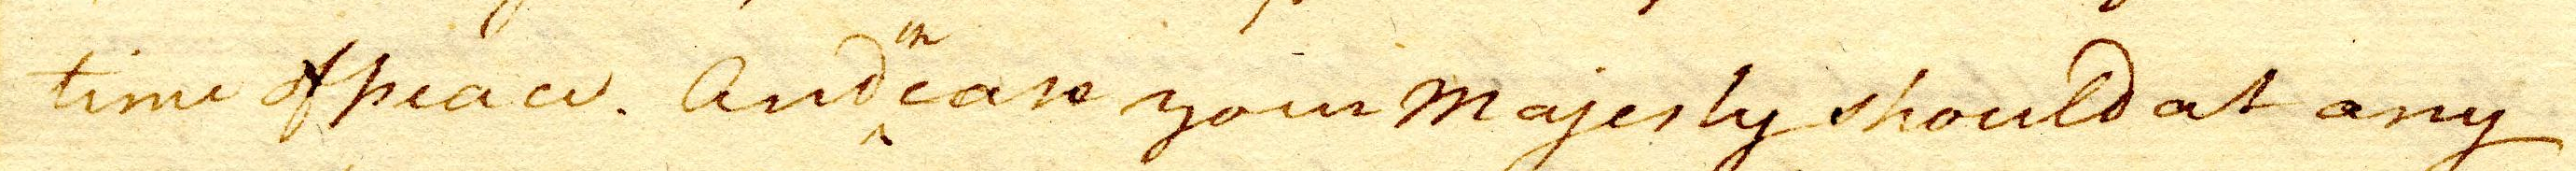time of peace. And ^in case your Majesty should at any
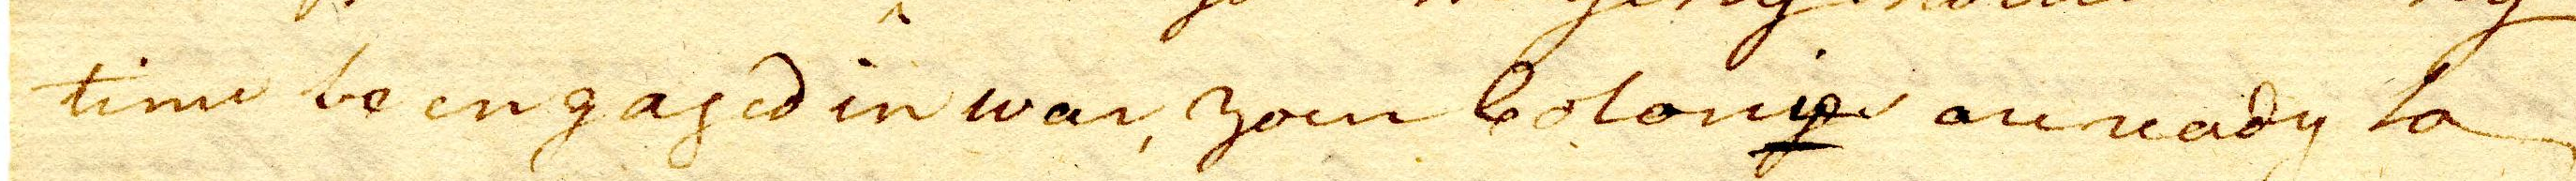time be engaged in war, your Colonys are ready to
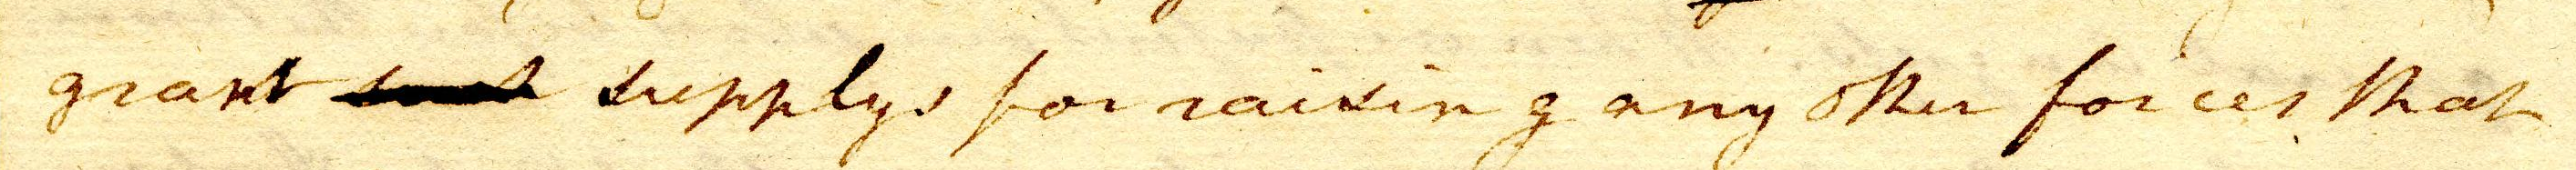grant supplys for raiding any other forces that
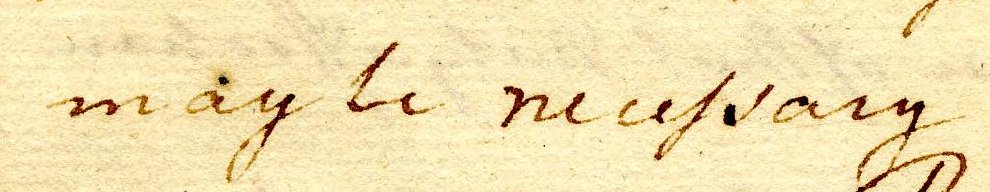may be necessary
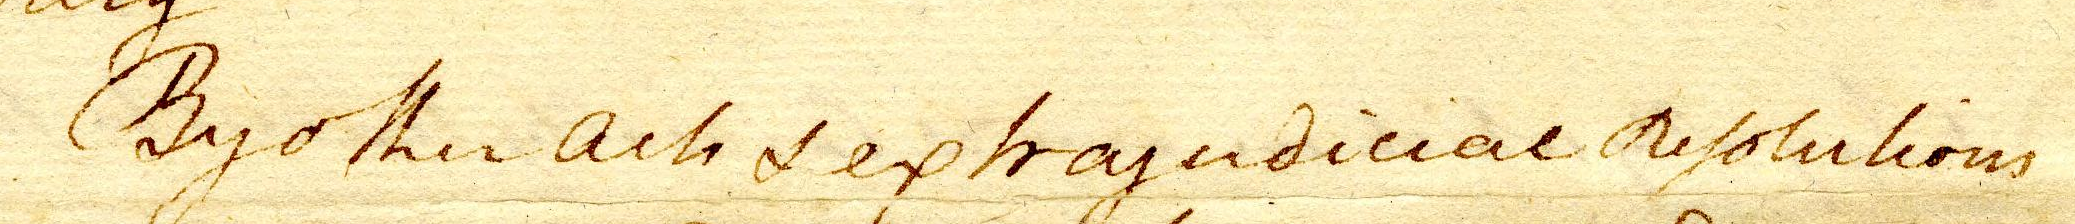By other Acts extrajudicial Resolutions
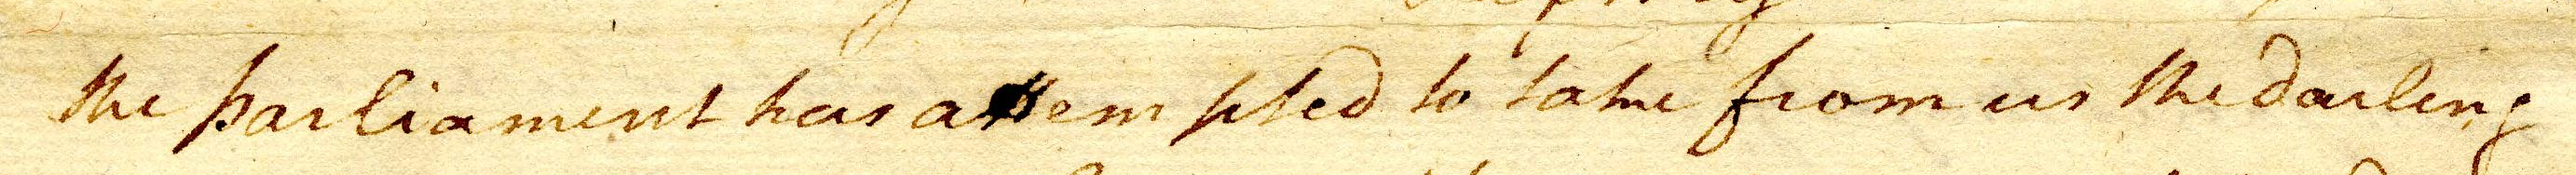the parliament has attempted to take from us the darling
